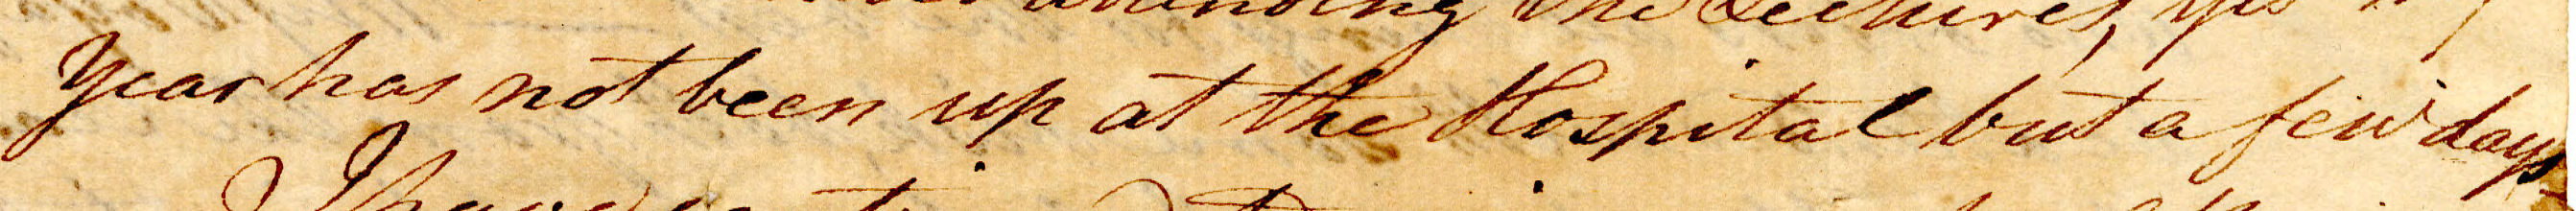year has not been up at the Hospital but a few days.
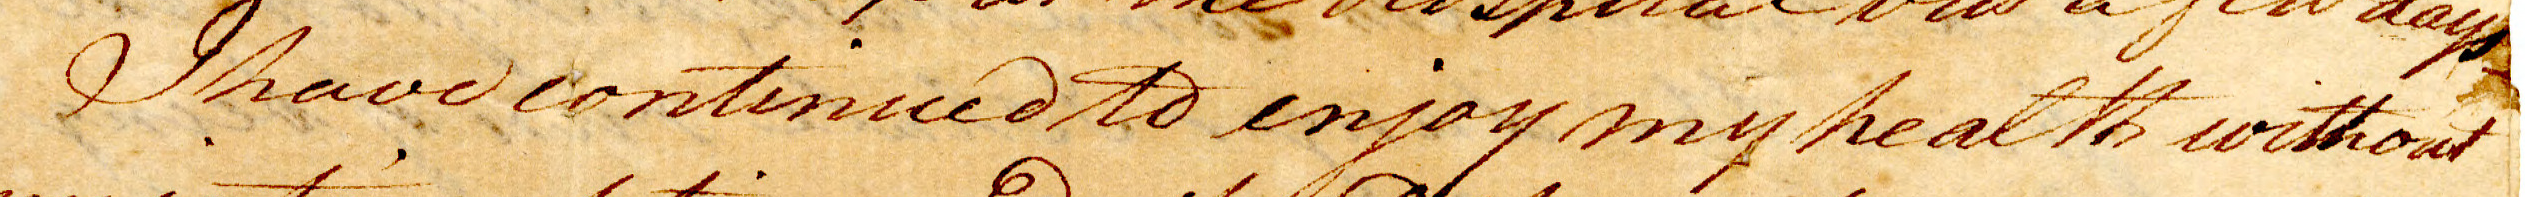I have continued to enjoy my health without
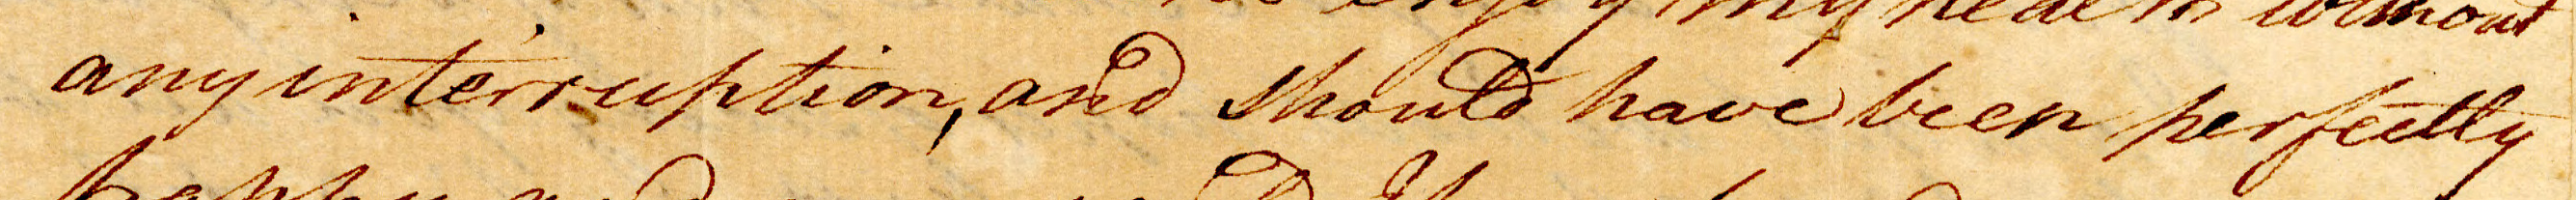any interruption, and should have been perfectly
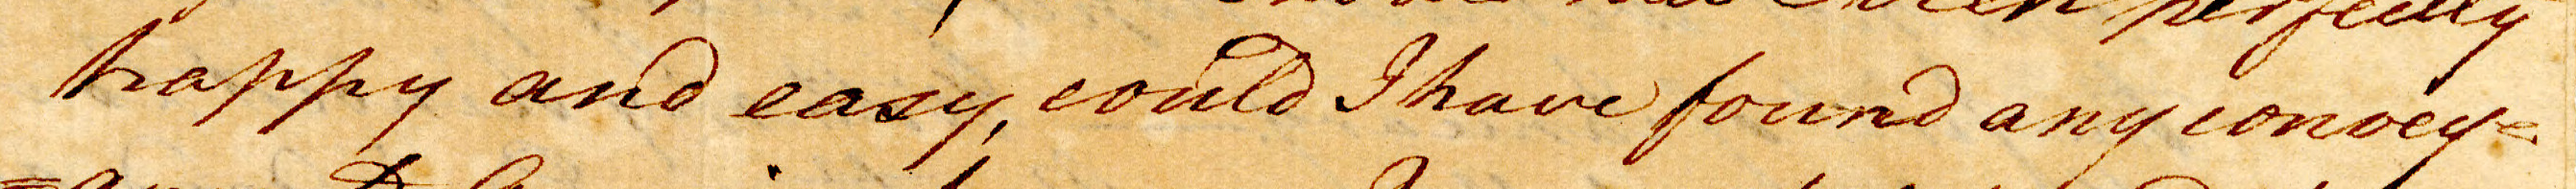happy and easy, could I have found any convey-
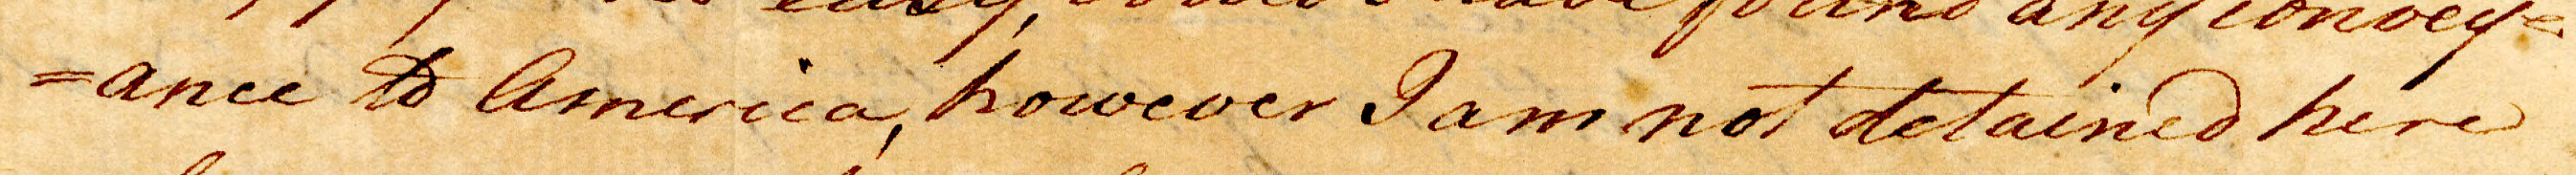-ance to America, however I am not detained here
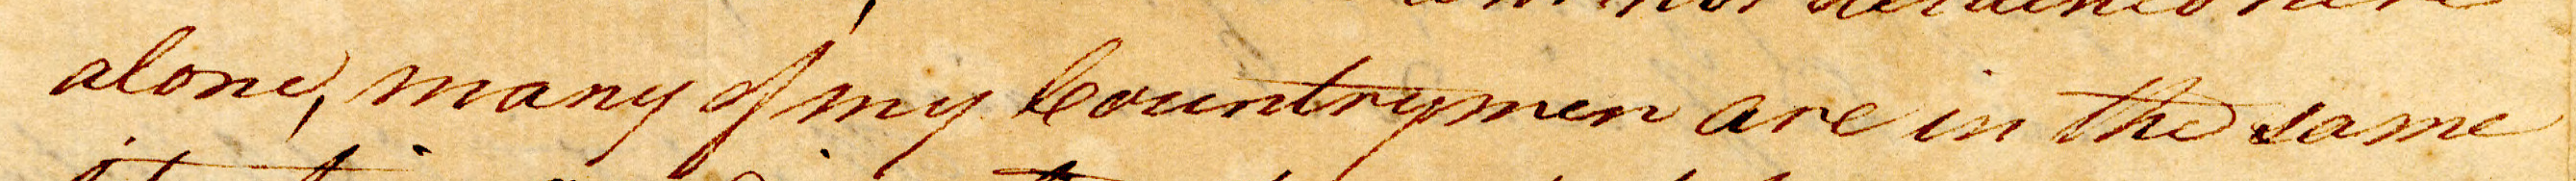alone, many of my Countrymen are in the same
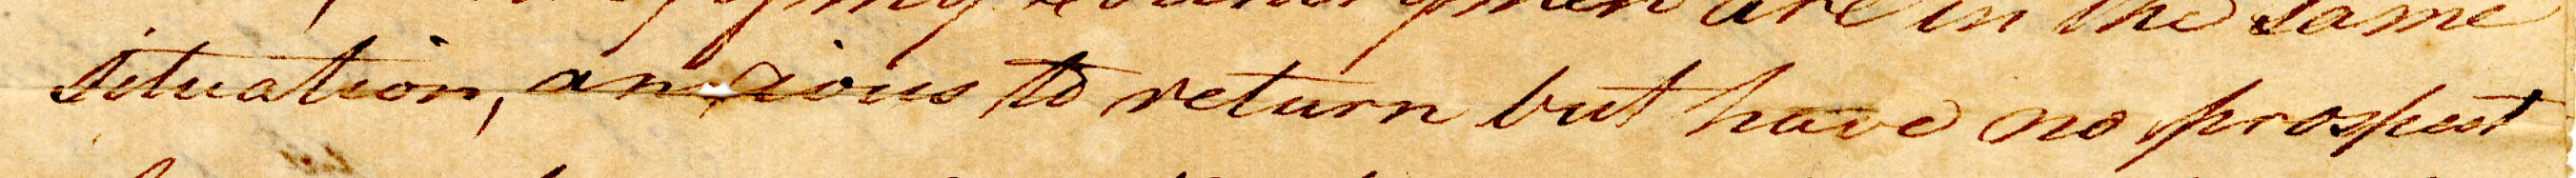situation, anxious to return but have no prospect
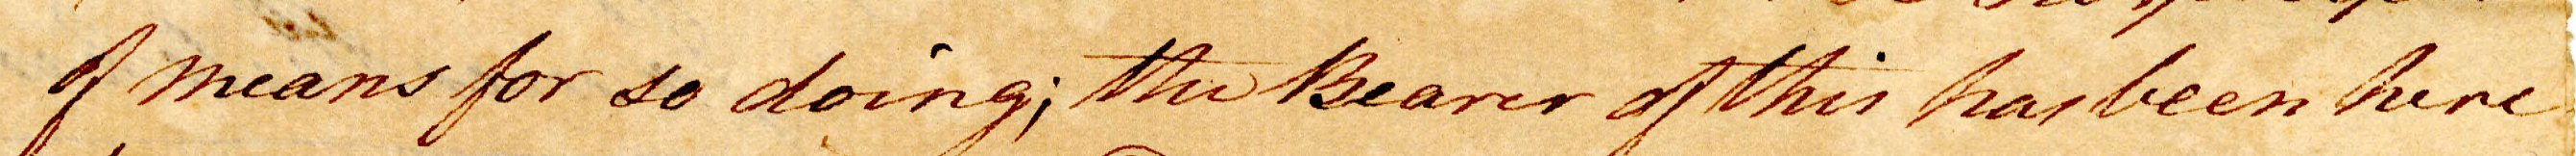of means for so doing; the Bearer of this has been here
